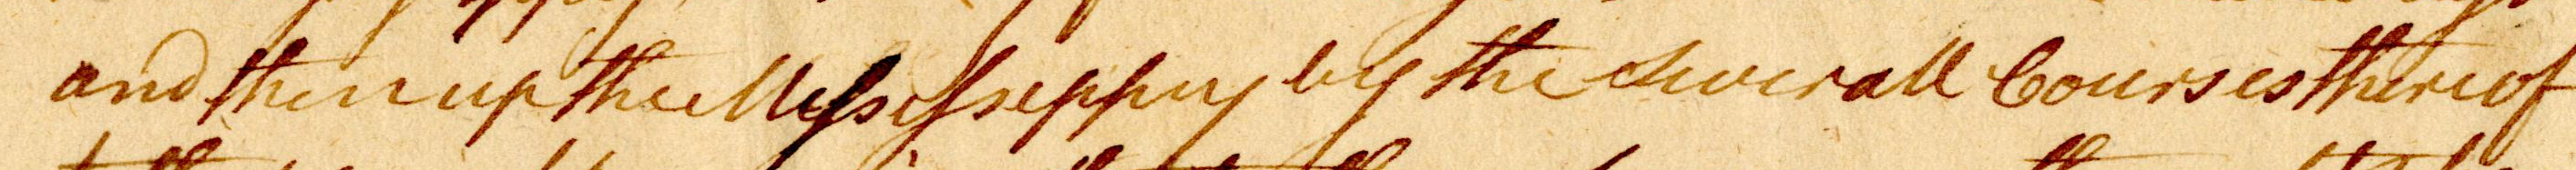and there up the Mississippy by the severall Courses thereof
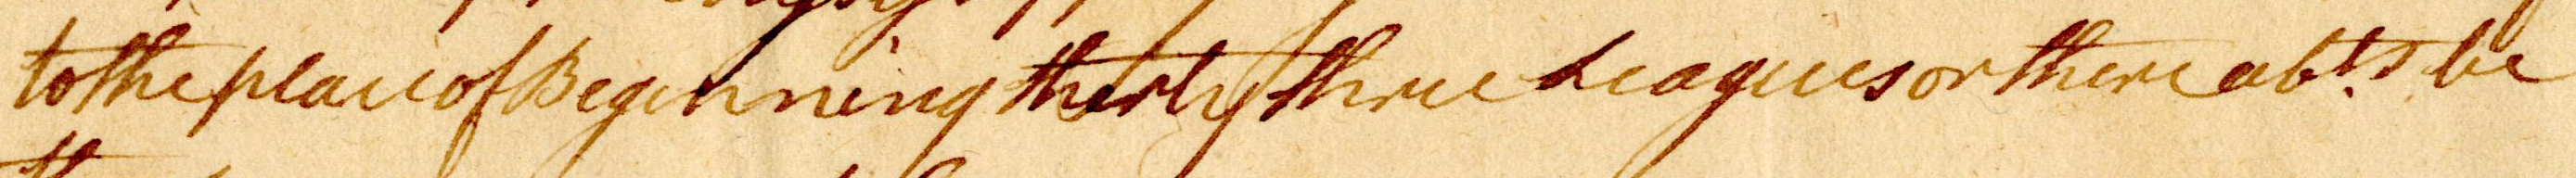to the place of Beginning thirty three Leagues or there ab^ts. be
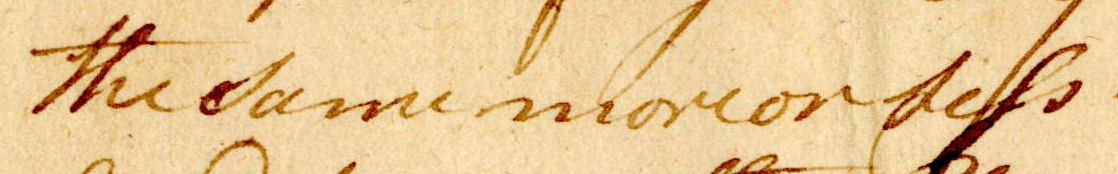the same more or less
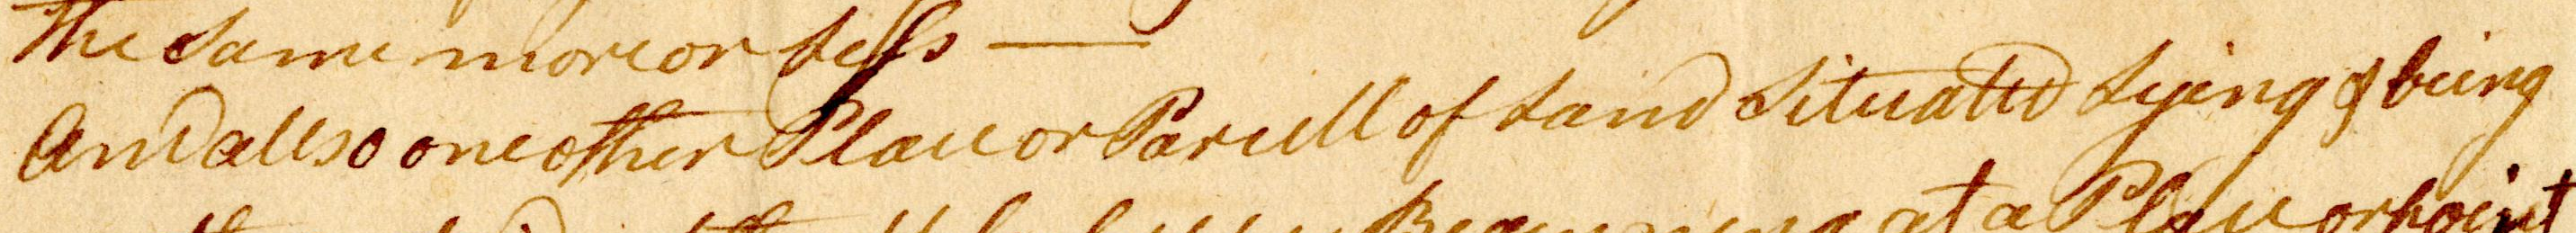And allso one other Place or Parcell of Land situated Lying & being
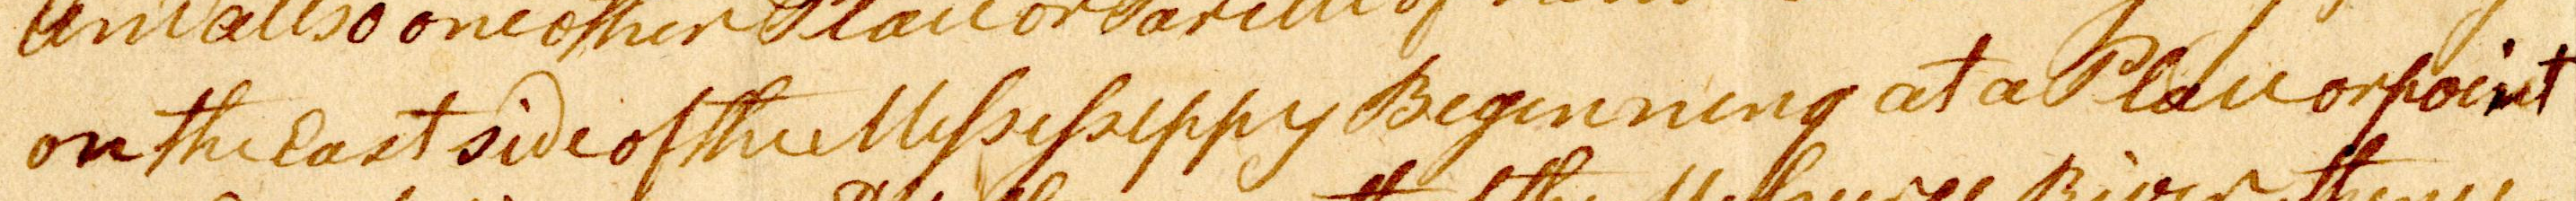on the East side of the Mississippy Beginning at a Place or point
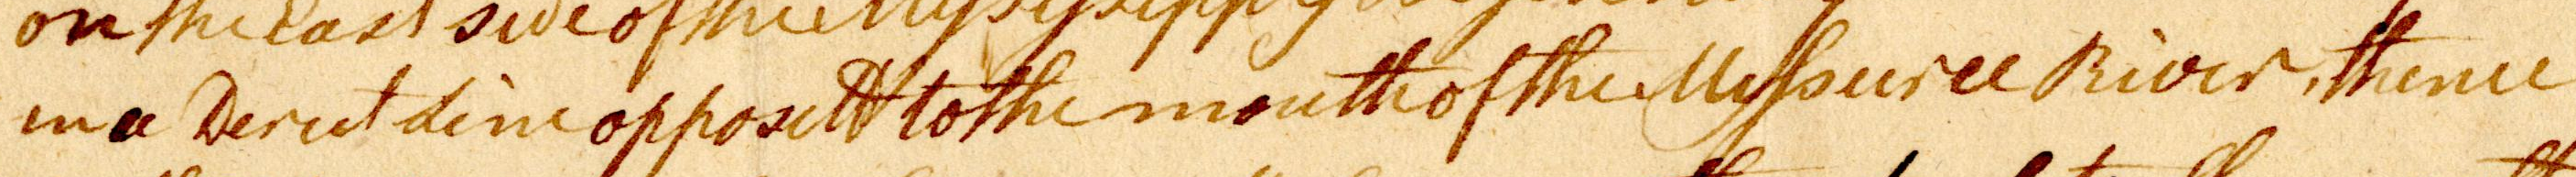in a Derect Line oppositt to the mouth of the Missuree River thence
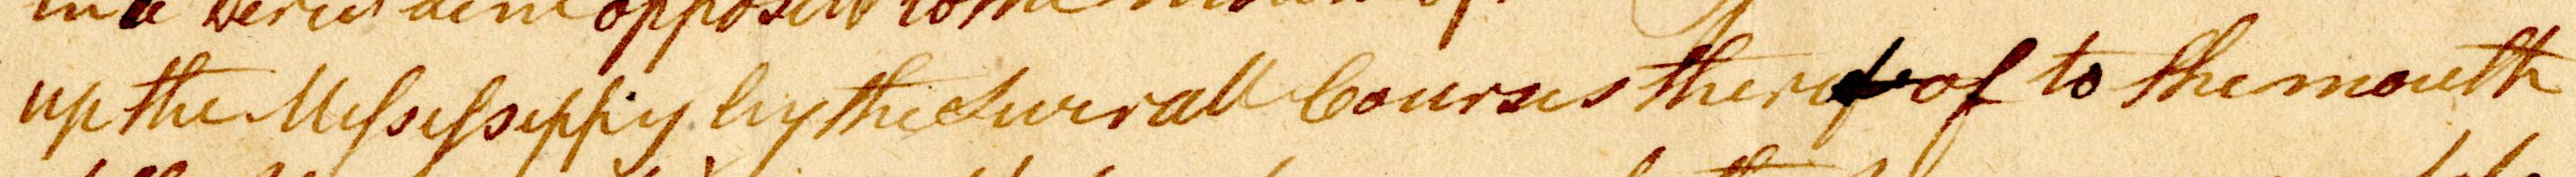up the Mississippy by the severall Courses thereof to the mouth
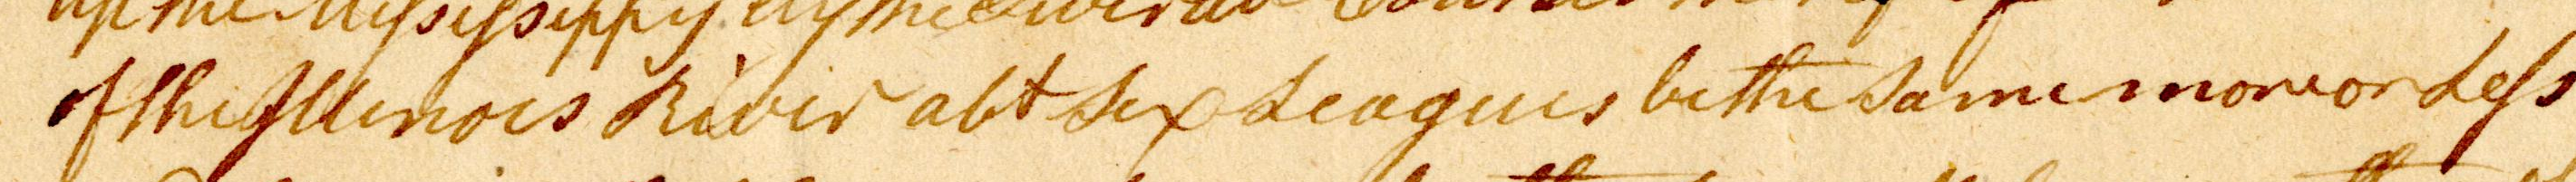of the Illinois River ab^t six Leagues be the same more or Less
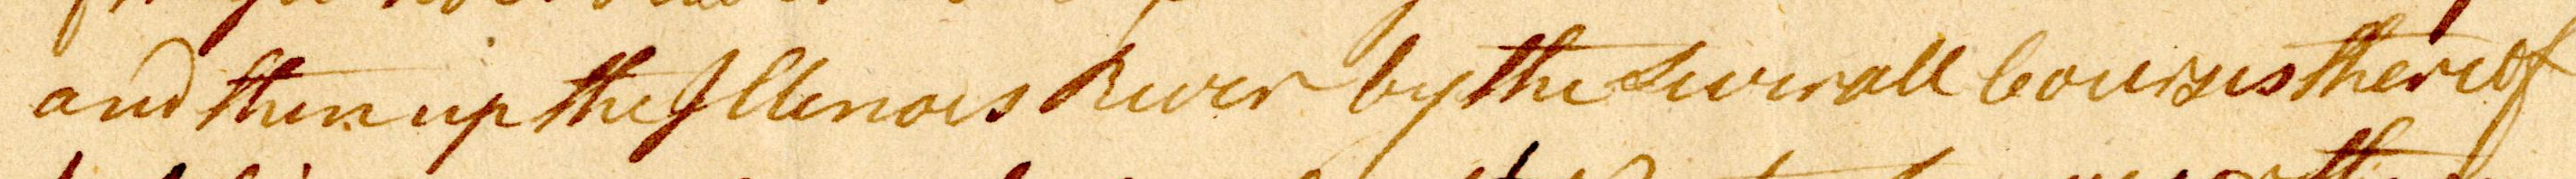and then up the Illinois River by the severall courses thereof
